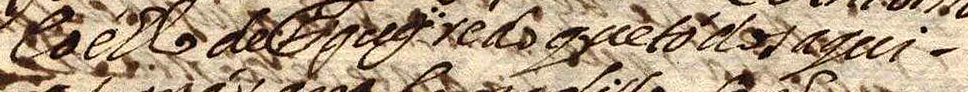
Coelho de Figueyredo que todos aqui
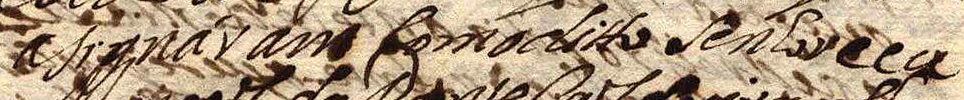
asignaram Com o ditto senhor e eu
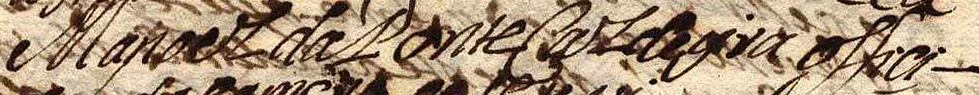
Manoel da Ponte CaLdeyra offici
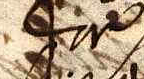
p̄.or
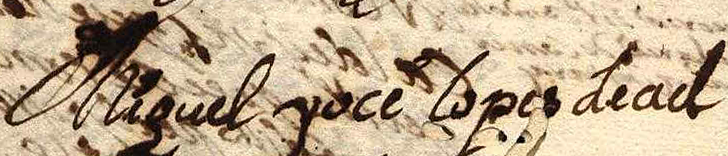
Miguel yoce lopes de ael
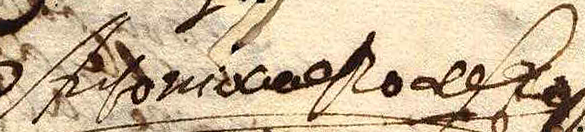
Antonio coelho de fdo
